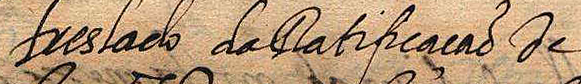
Treslado da Ratificaçaõ de
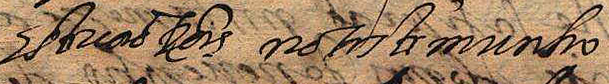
Esteuaõ Roīs no testemunho
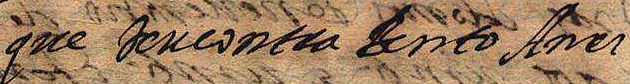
que deu contra Bento Anri
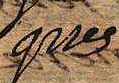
ques
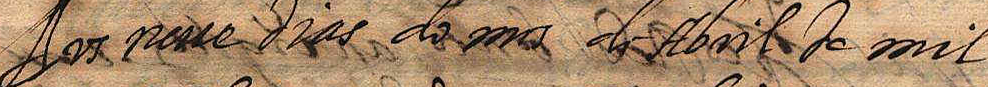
Aos noue dias do mes de Abril de mil
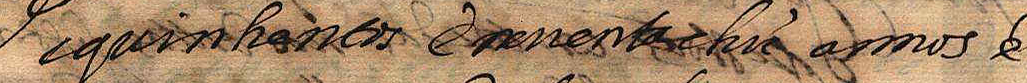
e quinhentos e nouenta e hū annos ē
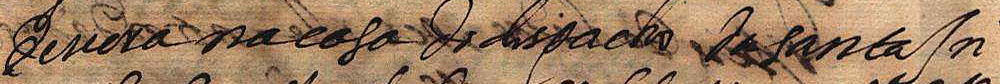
ē euora na casa do despacho da santa Jn
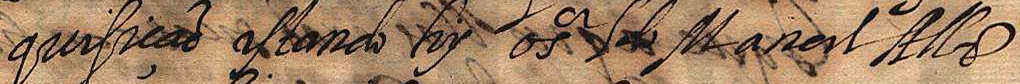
quisiçaõ estando hy o sor ldo Manoel Allz̄
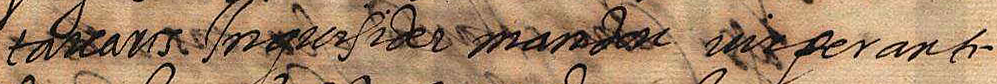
tauares Inquisidor mandou uir perante
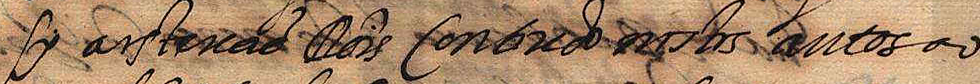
sy a esteuaõ Roīs Conteudo nestes autos ao
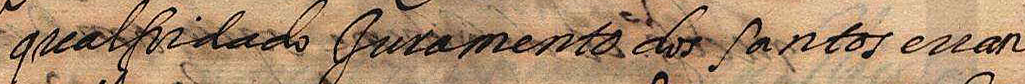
qual foi dado Juramento dos santos euan
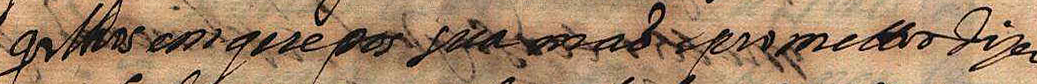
gelhos em que pos sua maõ e pometteo dizer
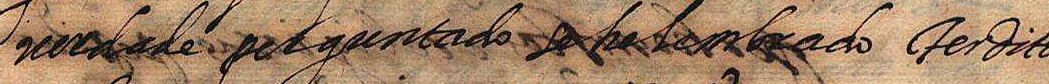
uerdade perguntado se he lembrado ter dito
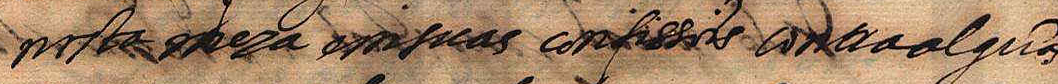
nesta meza em suas confissoīs contra alguās
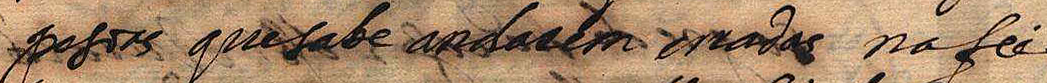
pesoas que sabe andasem erradas na fee
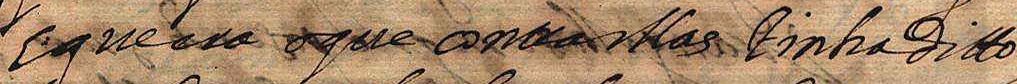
E que era o que contra ellas tinha ditto
